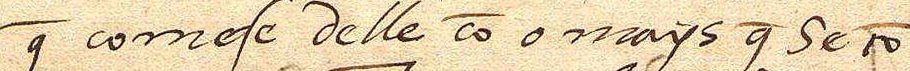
q̄ comese delle c̄o o mays q̄ Se c̄o
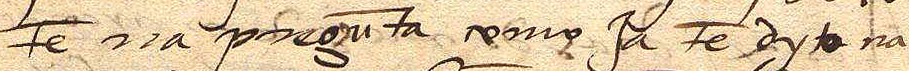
t̄e na preḡuta como Ja t̄e dyto na
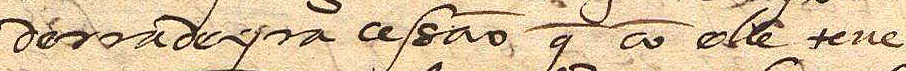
derradeyra cessão q̄ c̄o elle teue
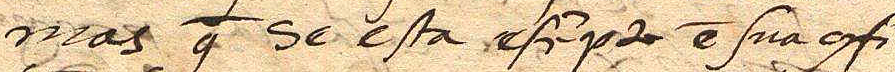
mas q̄ Se esta esc̄pto ē sua ꝯfi
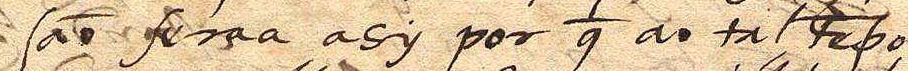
são seraa asy por q̄ ao tal t̄epo
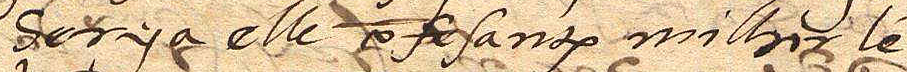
Serya elle cōfesante milhor lē
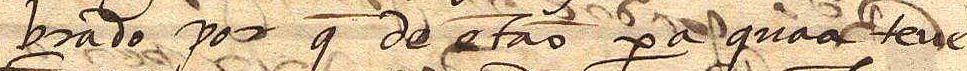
brado por q̄ de ētão ꝑa quaa teue
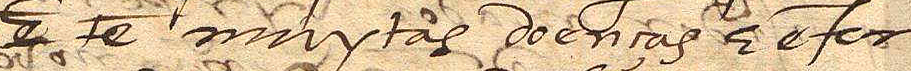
e t̄e muytas doenças E ēfer
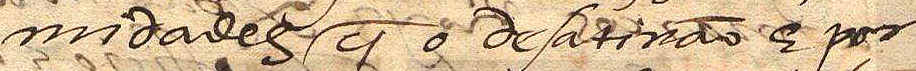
midades q̄ o desatinão E por
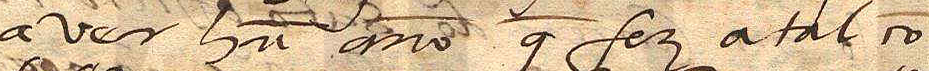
a ver hū an̄o q̄ fez a tal c̄o
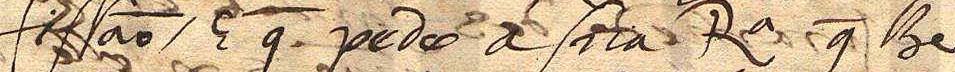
fissão / E q̄ pede a sua Ra q̄ lhe
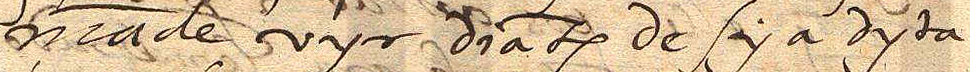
māde vyr diātꝭ de sy a dyta
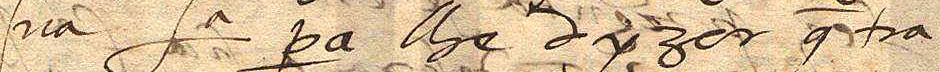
sua fa ꝑa lhe dyzer q̄ tra
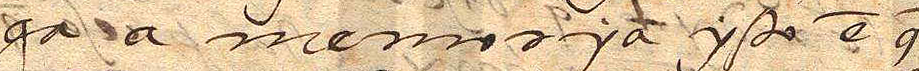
ga a memorya ysto ē q̄
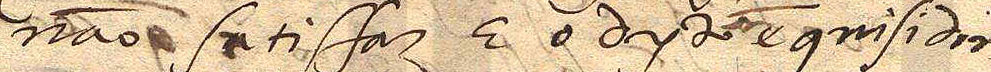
não satisfaz E o dyto ēquisidor
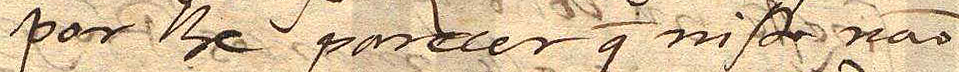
por lhe parecer q̄ nisto não
